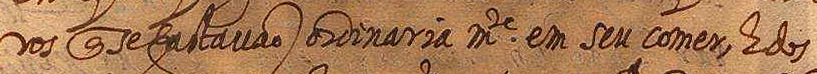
ros q̄ se gastauão ordinariamte em seu comer E dos
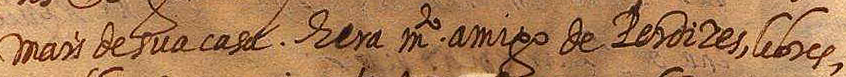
mais de sua casa. E era mto amigo de Perdizes, lebres,
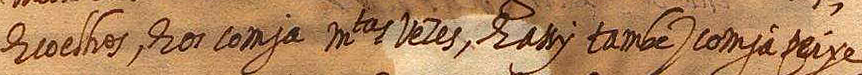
E coelhos, E os comja mtas vezes, E assy tambē comja peixe
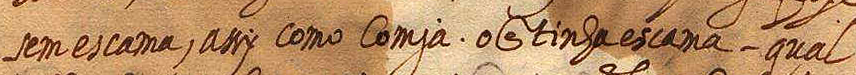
sem escama, assy como comja o q̄ tinha escama quaL
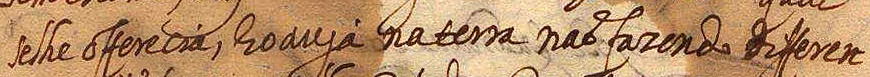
se lhe offerecia, E o auja na terra não fazendo differen
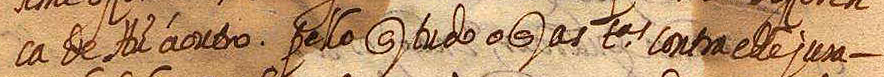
ça de Hū a outro. pello q̄ tudo o q̄ as tas. contra elle jura
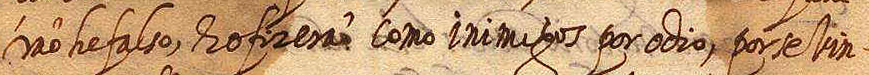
rão he falso, E o fizerão como inimigos por odio, por se vin
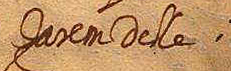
garem delle.
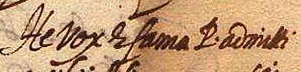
He vox E fama P. admitti
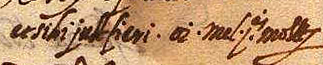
et sibi just fieri. oi. mel j.is mol
